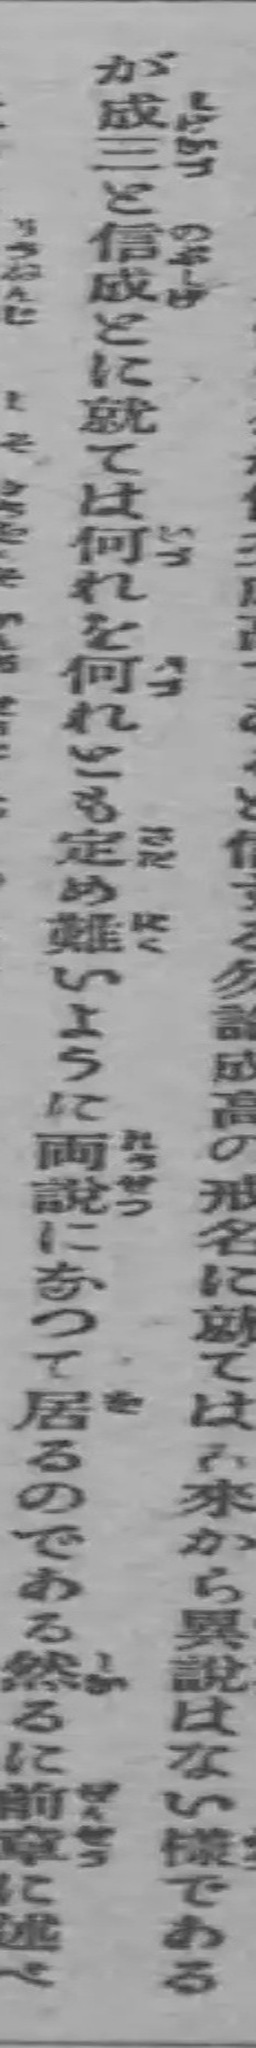が成三と信成とに就ては何れを何れとも定め難いように両説になつて居るのである然るに前章に述べ
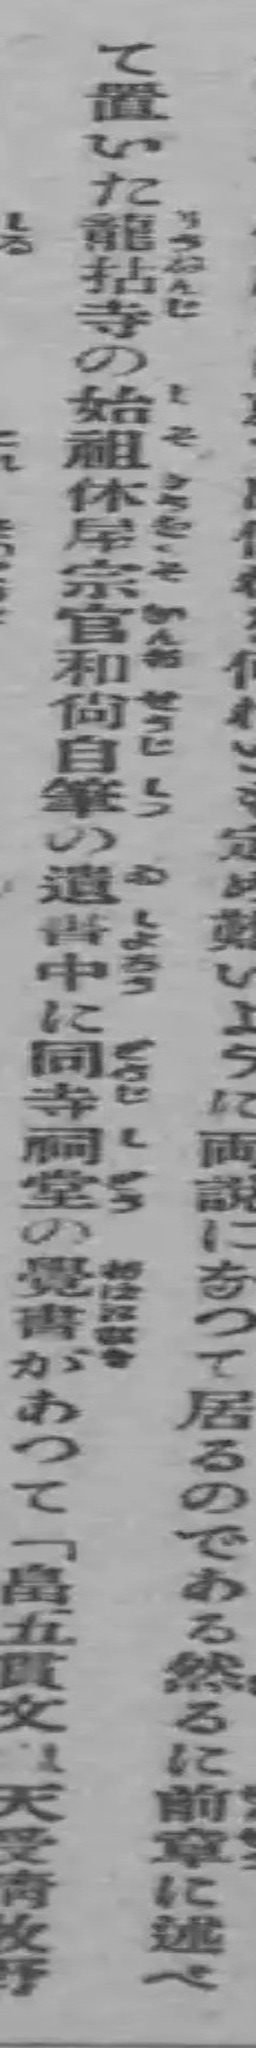龍拈寺文書て置いた龍拈寺の始祖休屋宗官和尚自筆の遺書中に同寺祠堂の覚書があつて「畠五貫文以天受清牧野
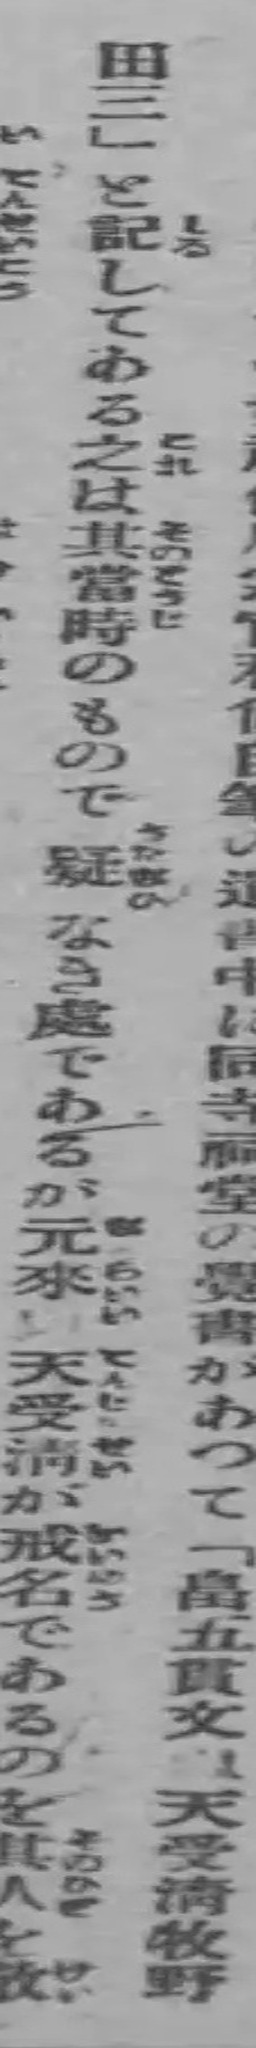田三」と記してある之は其当時のもので疑なき処であるが元来以天受清が戒名であるのを其人を敬
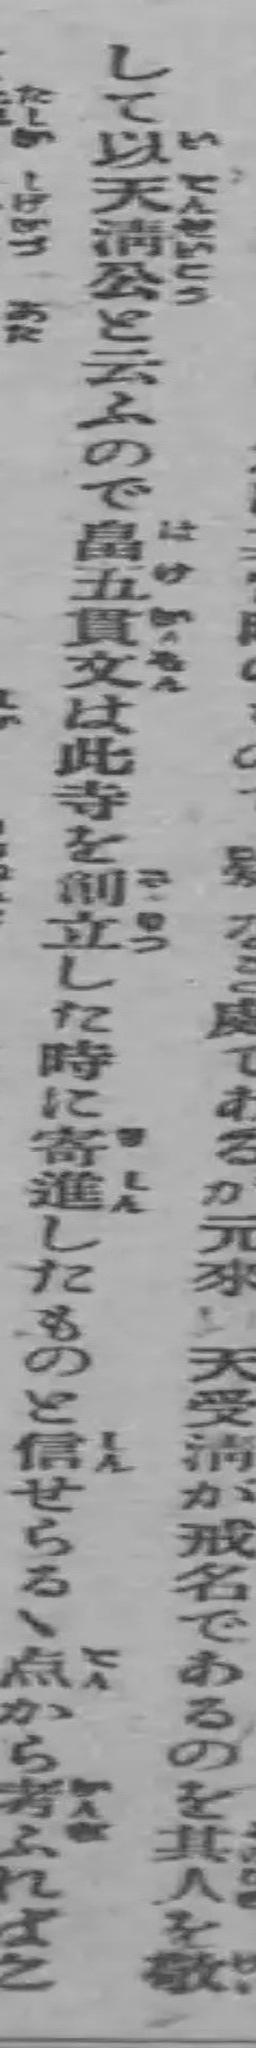して以天清公と云ふので畠五貫文は此寺を創立した時に寄進したものと信せらるゝ点から考ふれば之
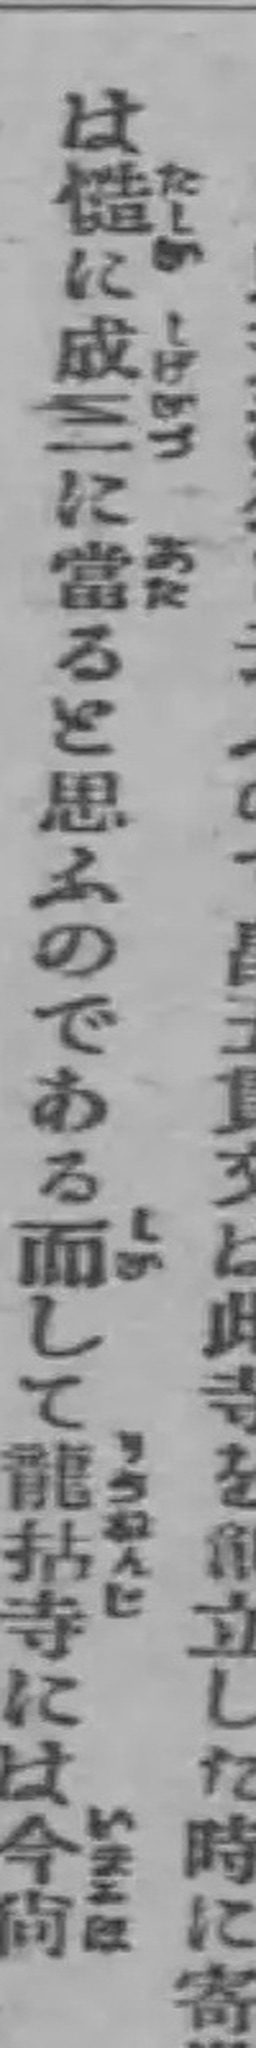は慥に成三に当ると思ふのである而して龍拈寺には今尚
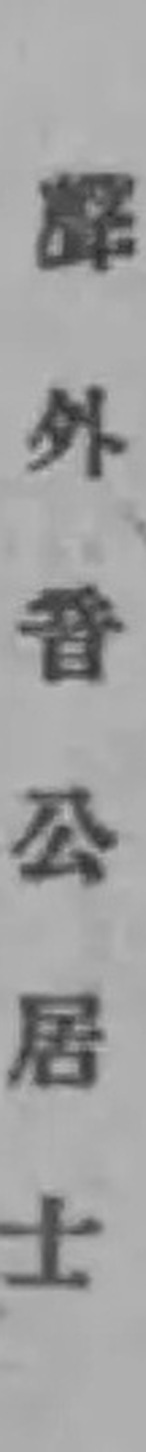声外音公居士
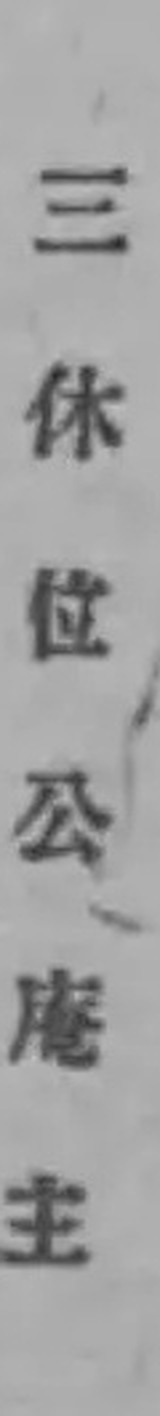三休位公庵主
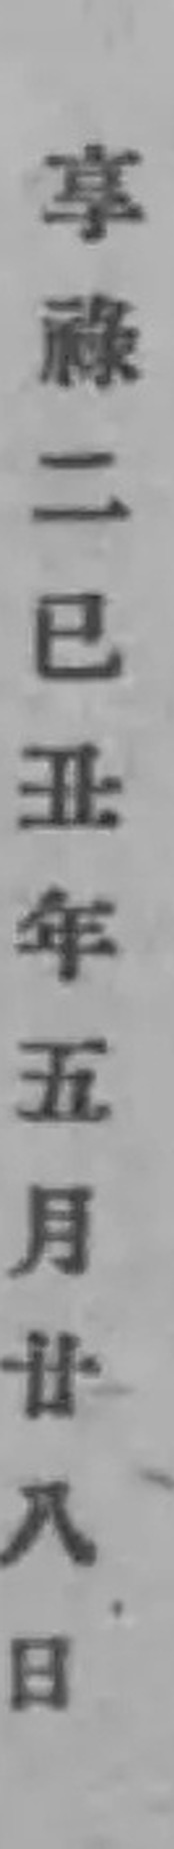(裏)享禄二巳丑年五月廿八日
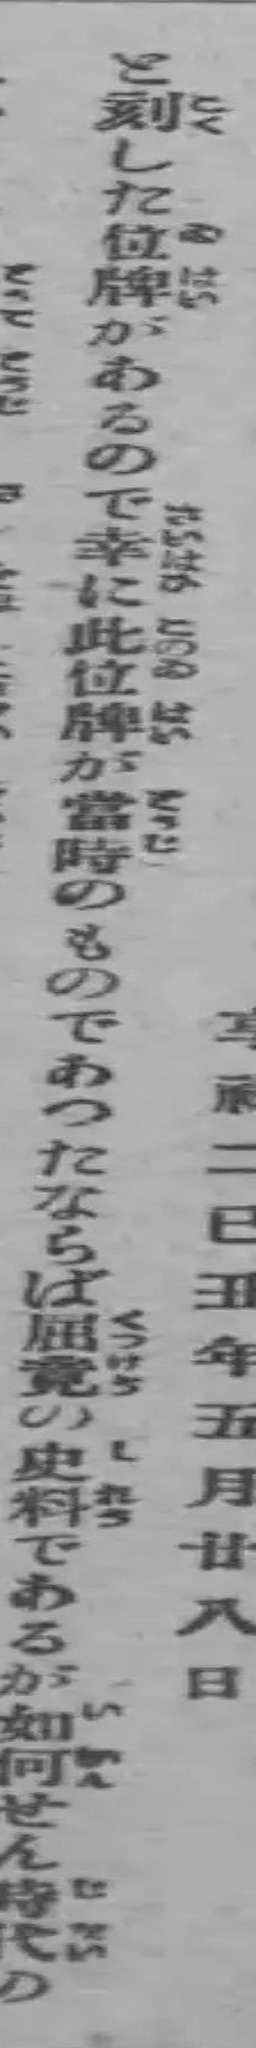と刻した位牌があるので幸に此位牌が当時のものであつたならば屈竟史料であるが如何せん時代の
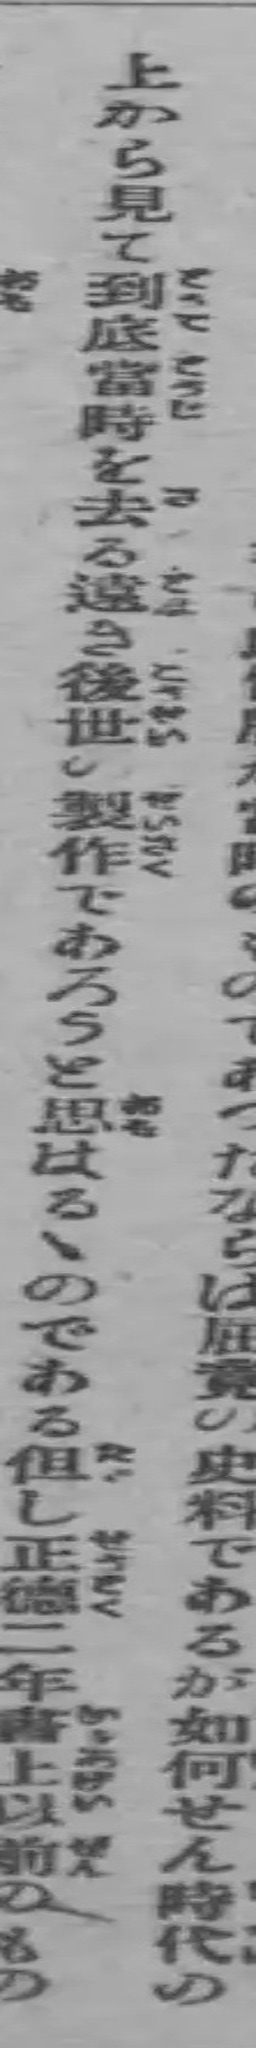上から見て到底当時を去る遠き後世の製作であろうと思はるゝのである但し正徳二年書上以前のもの
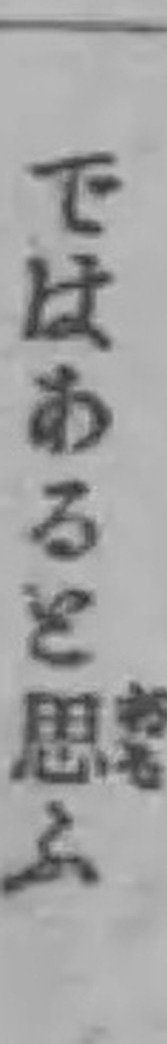ではあると思ふ
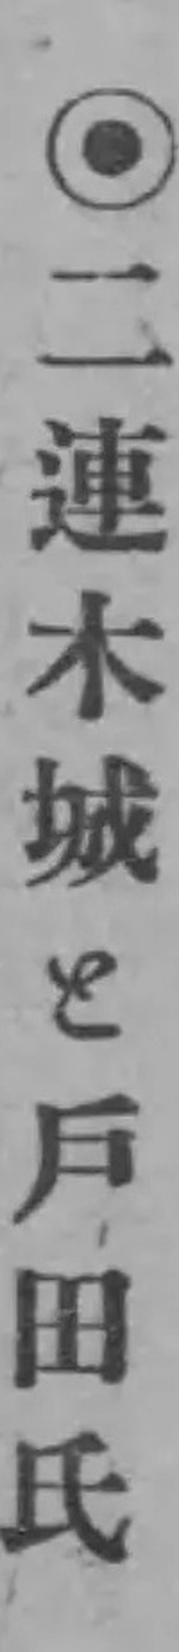⦿二連木城と戸田氏
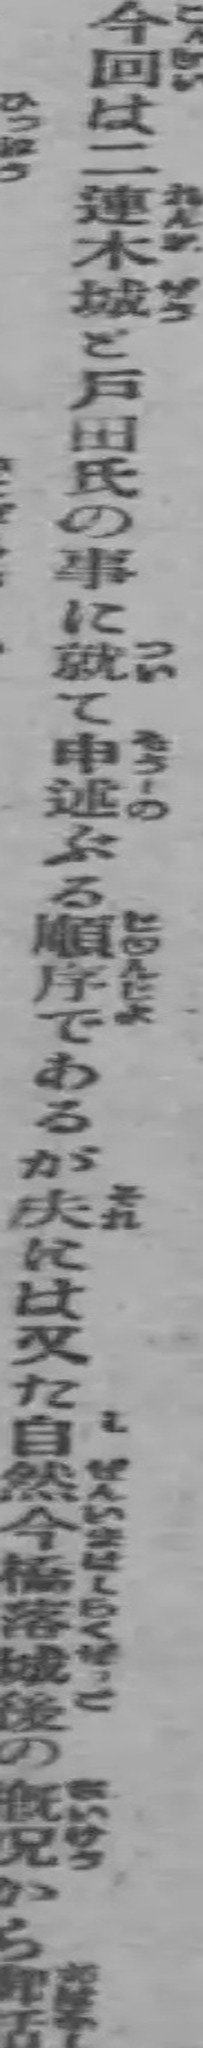今回は二連木城と戸田氏の事に就て申述ぶる順序であるが夫には又た自然今橋落城後の概況から御話
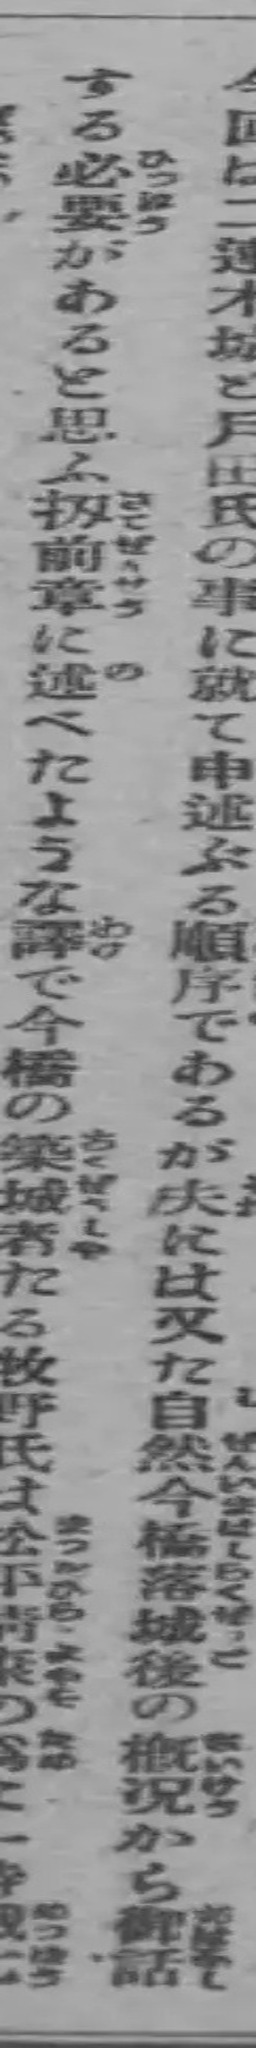する必要があると思ふ扨前章に述べたような訳で今橋の築城者たる牧野氏は松平清康の為に一時滅亡
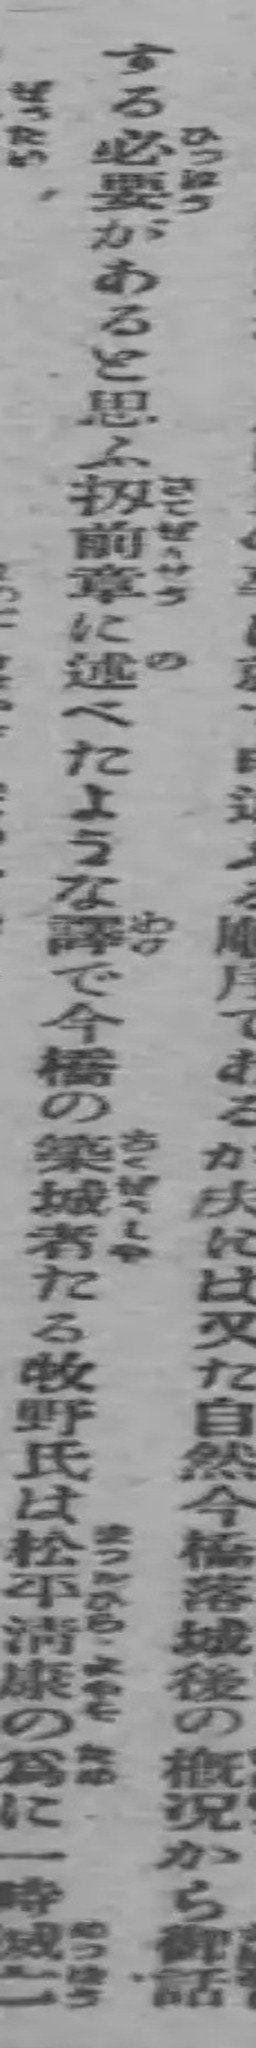する必要があると思ふ扨前章に述べたような訳で今橋の築城者たる牧野氏は松平清康の為に一時滅亡
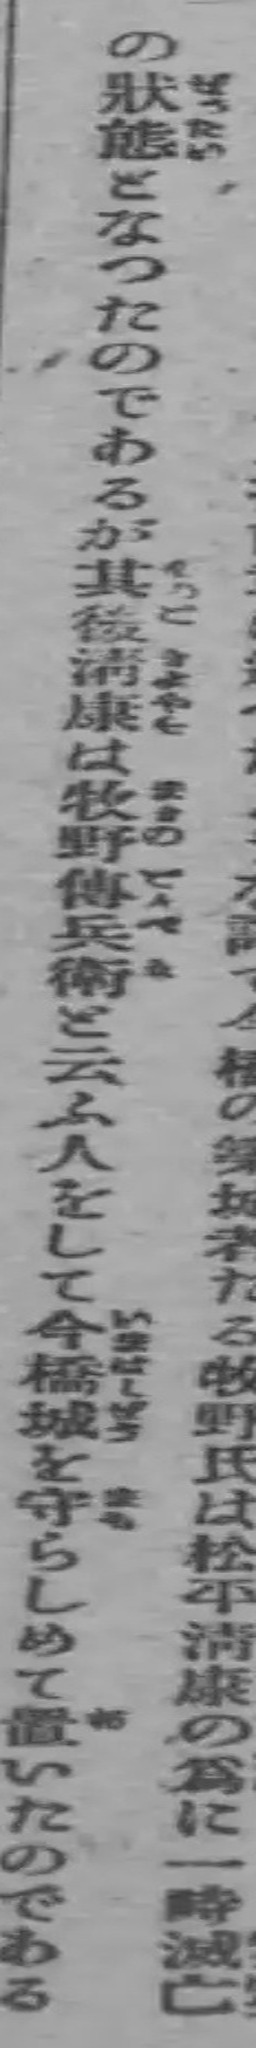の状態となつたのであるが其後清康は牧野傳兵衛と云ふ人をして今橋城を守らしめて置いたのである
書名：豊橋市史談
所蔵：国立国会図書館 National Diet Library, JAPAN
